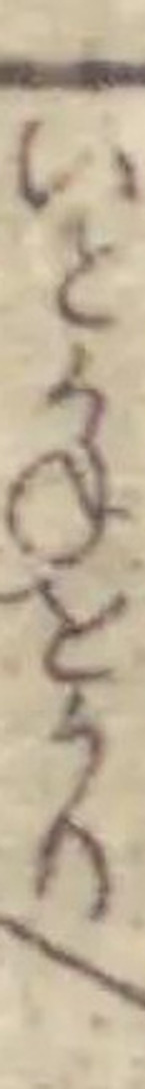いとかねをかり
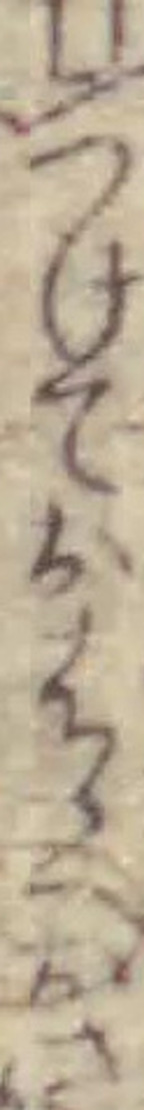つけておはらへおさ
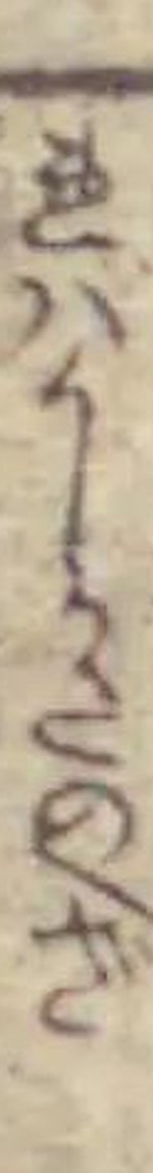ればかしかたのざ
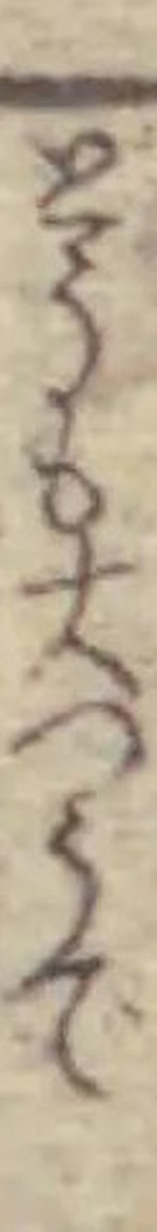とうも大つうで
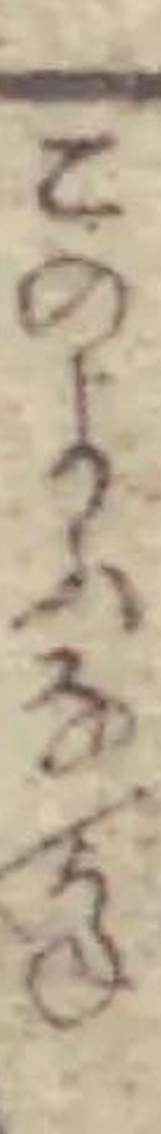このよふなかね
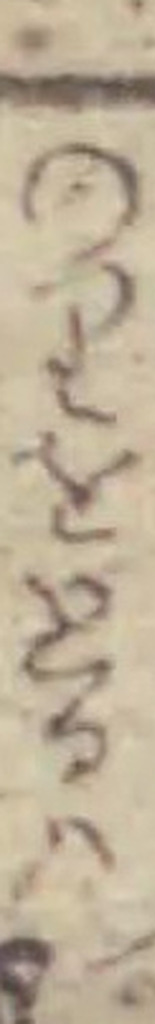のりをとるは
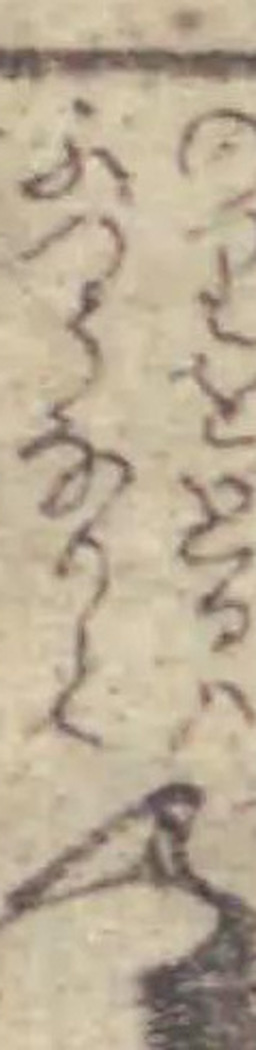ふつうなりと
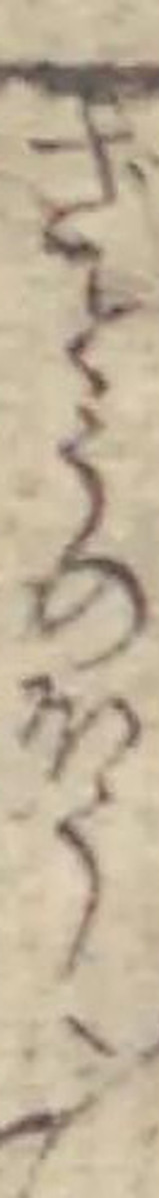ざとうのほう
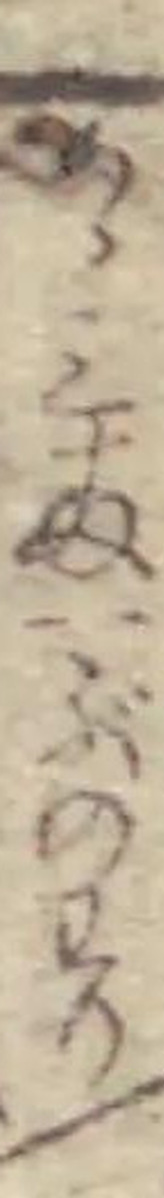から三両一ぶのわり
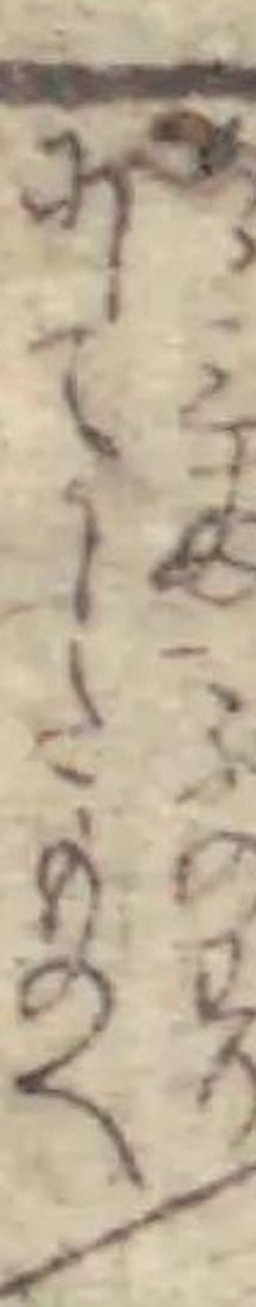にしてかしたものへ
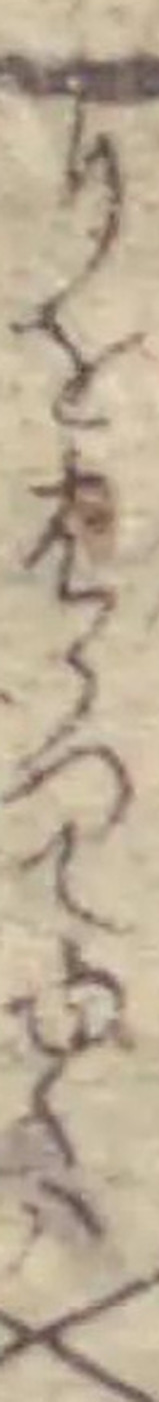りをはらつてゆくは
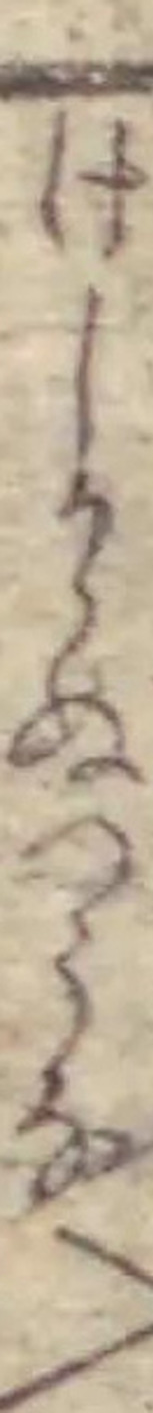けしからぬつうな
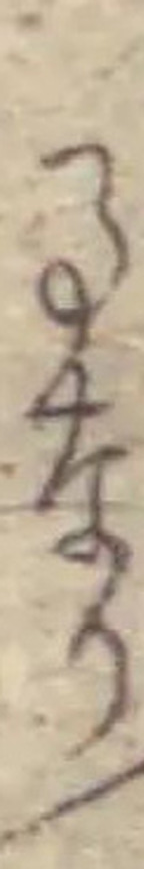事なり
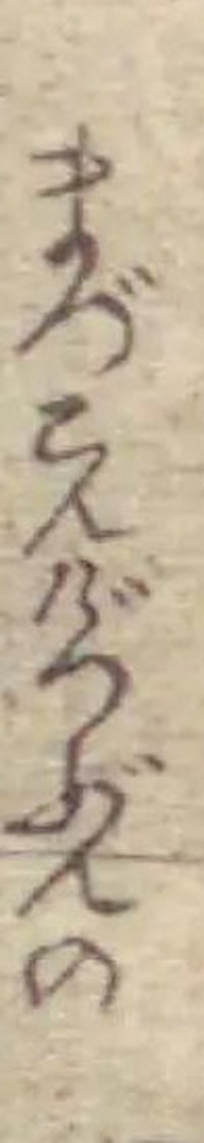まづこんげつぶんの
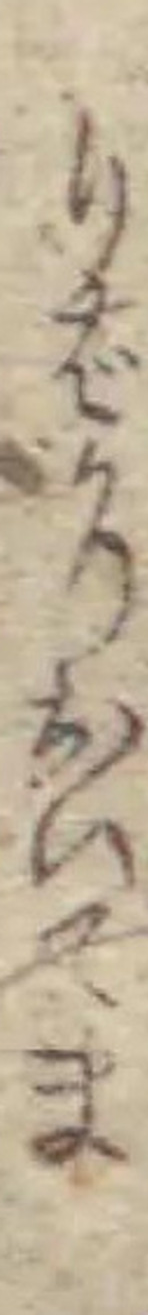りばかりおいてま
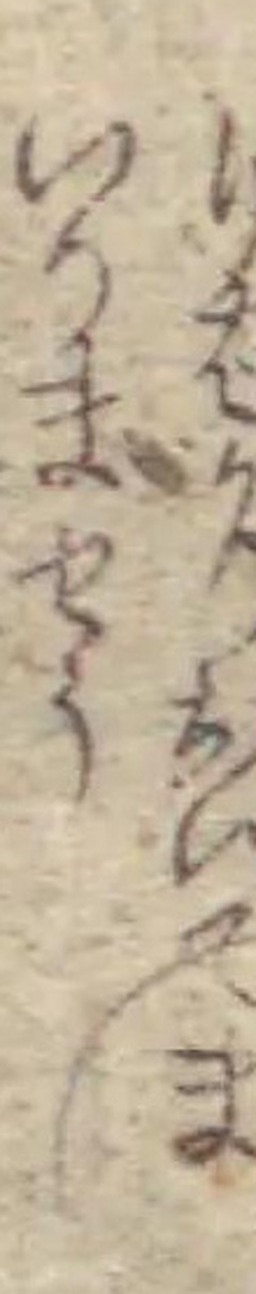いりませう
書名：茶羅毛通人 3巻
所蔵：国立国会図書館 National Diet Library, JAPAN
